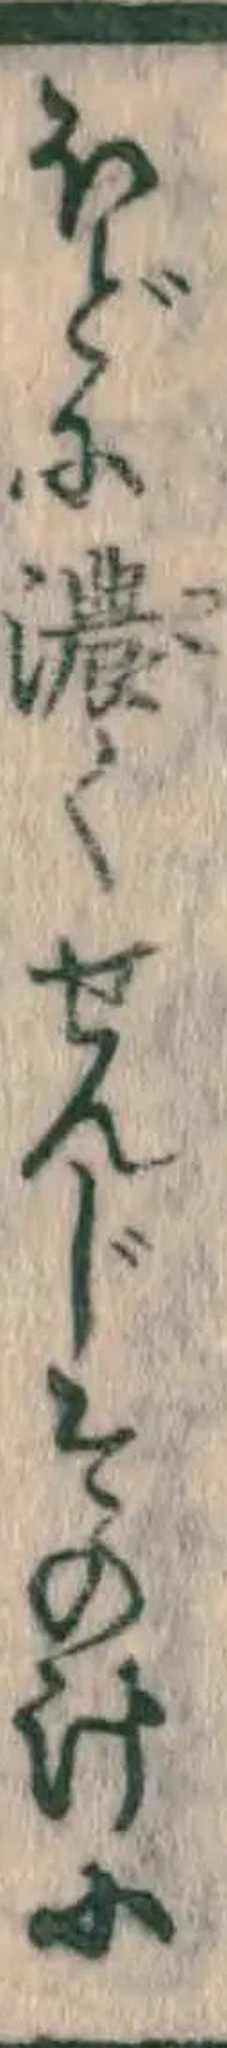ほどに濃くせんじその汁に
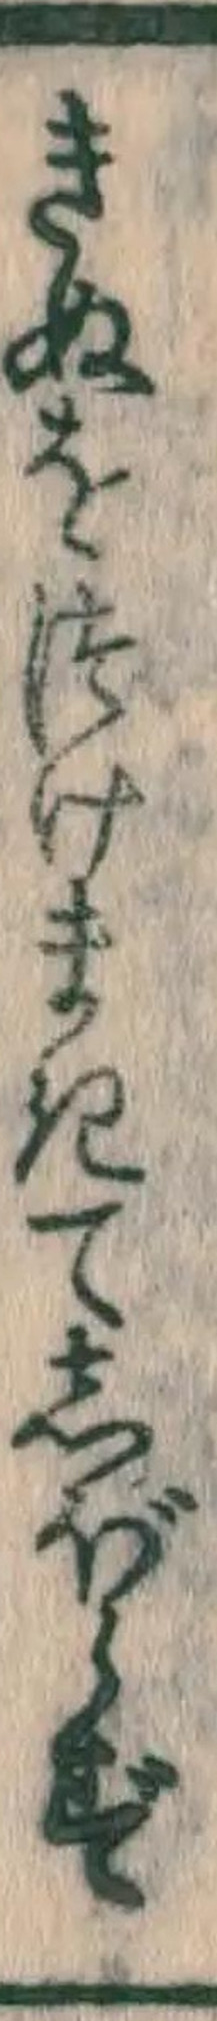きぬをつけまきてしぼらず
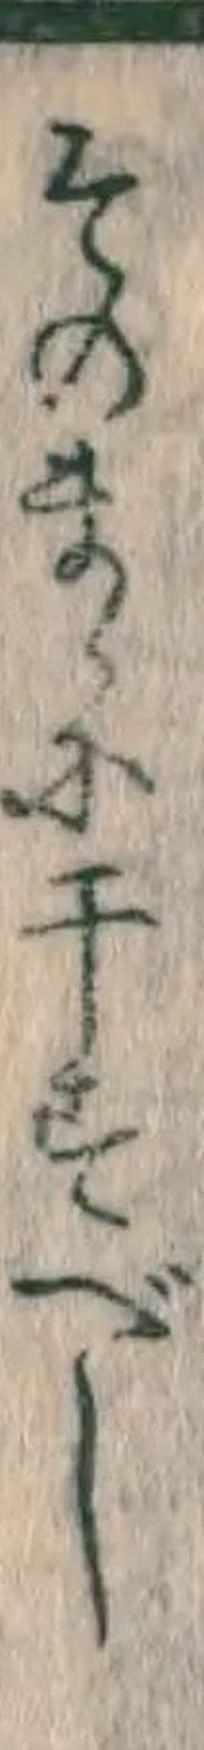そのまゝに干すべし
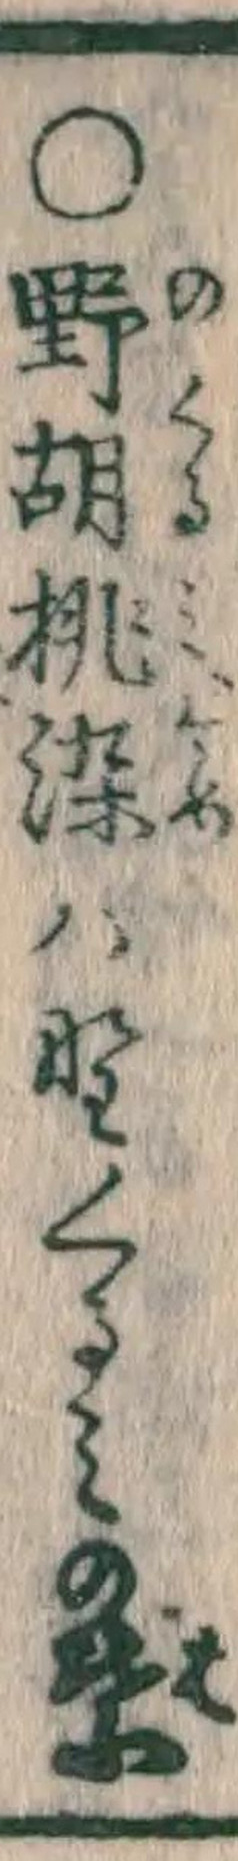○野胡桃染は野くるみの葉
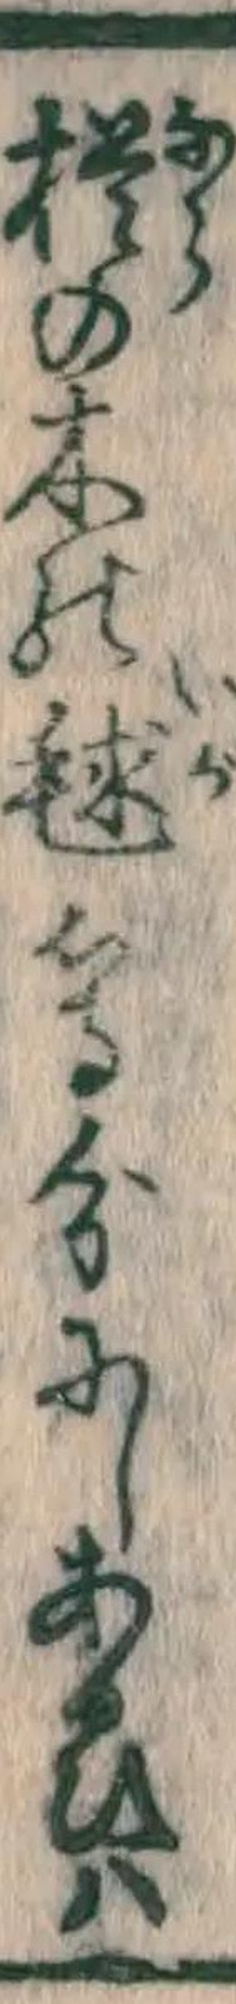楢の木の毬等分にしあるひは
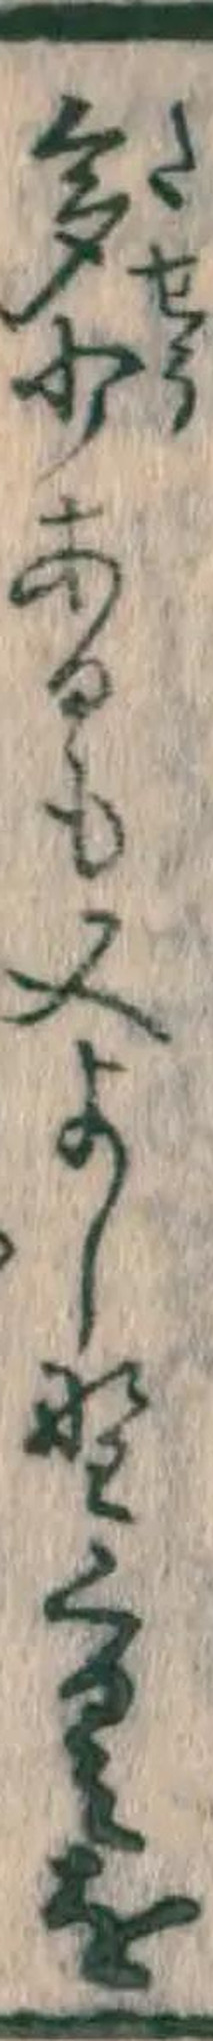多少あるも又よし野くるみを
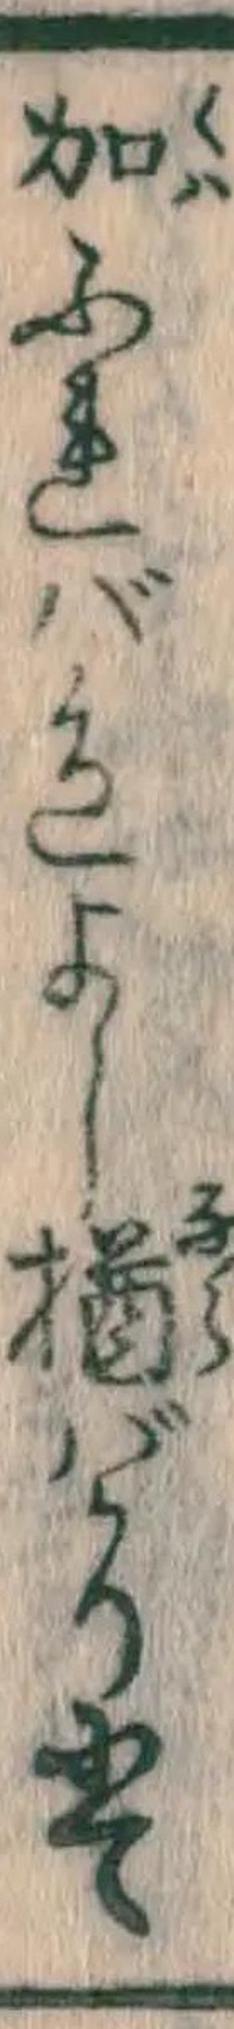加ふれば色よし楢ばかりにて
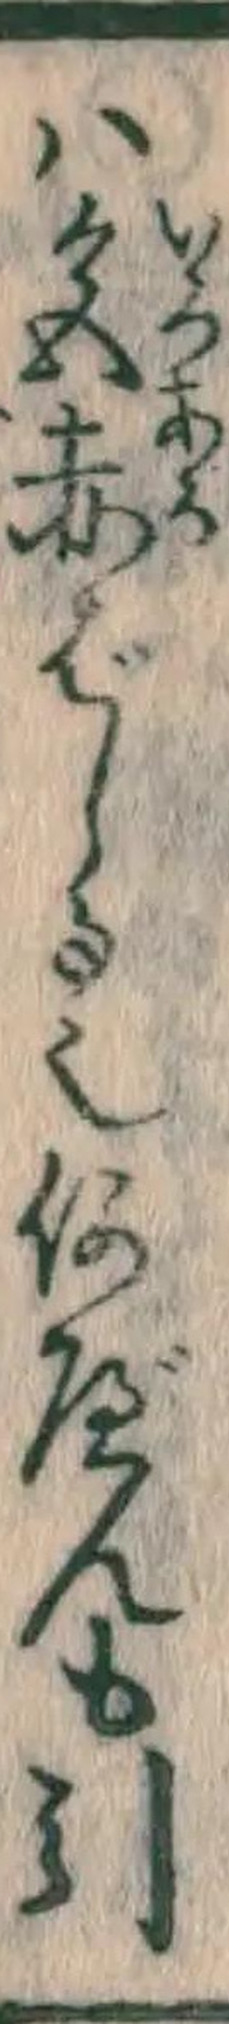は色赤ばしる也何べんも引
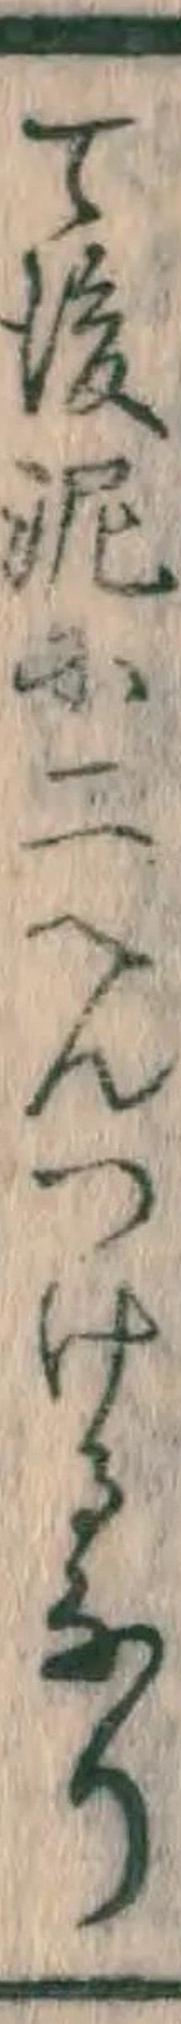て後泥に二へんつけるなり
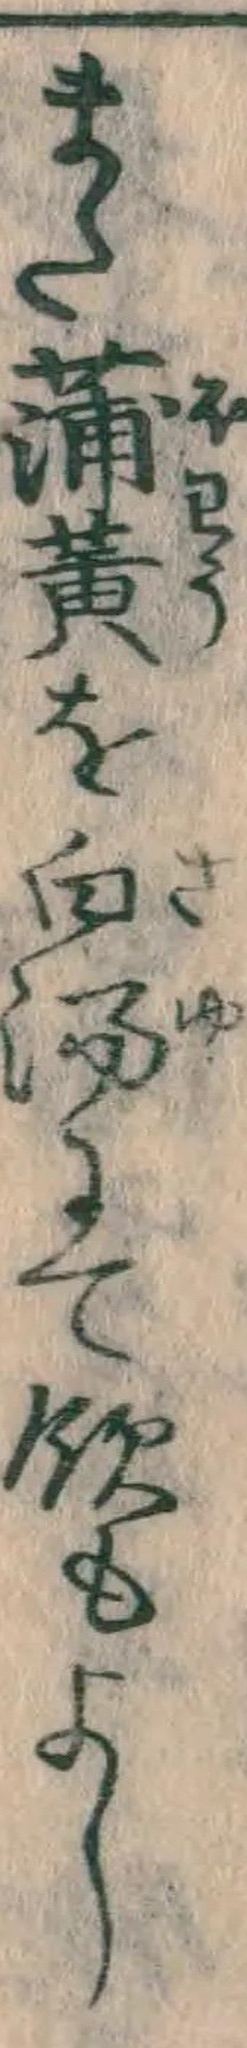また蒲黄を白湯にて飲もよし
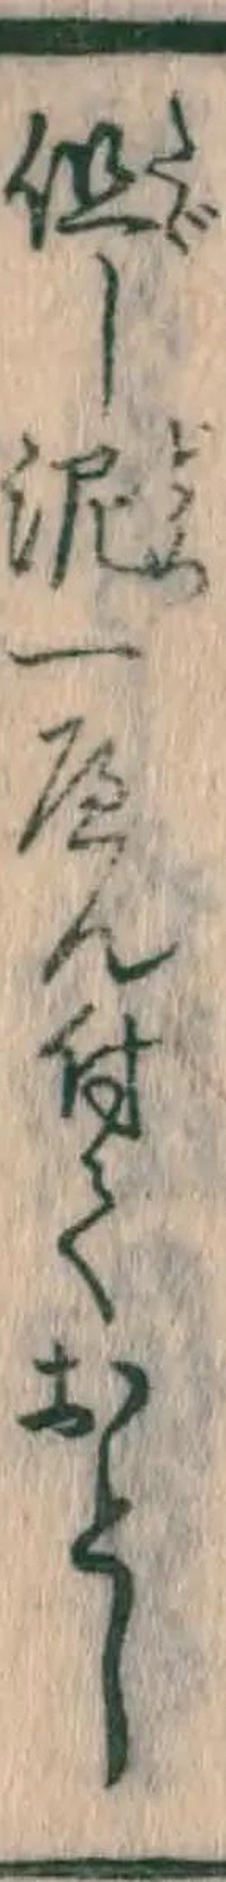但し泥一へん付ておとし
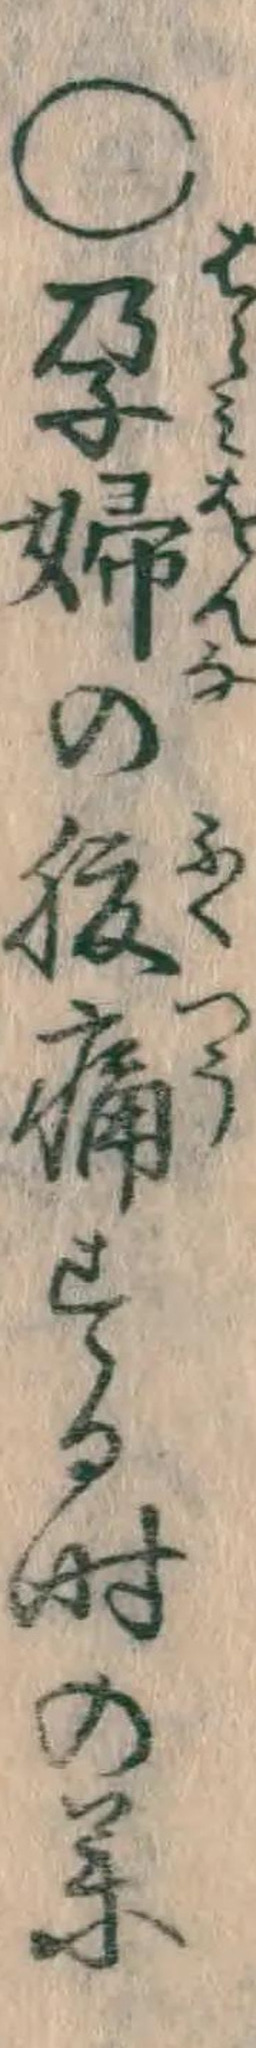○孕婦の腹痛する時の薬
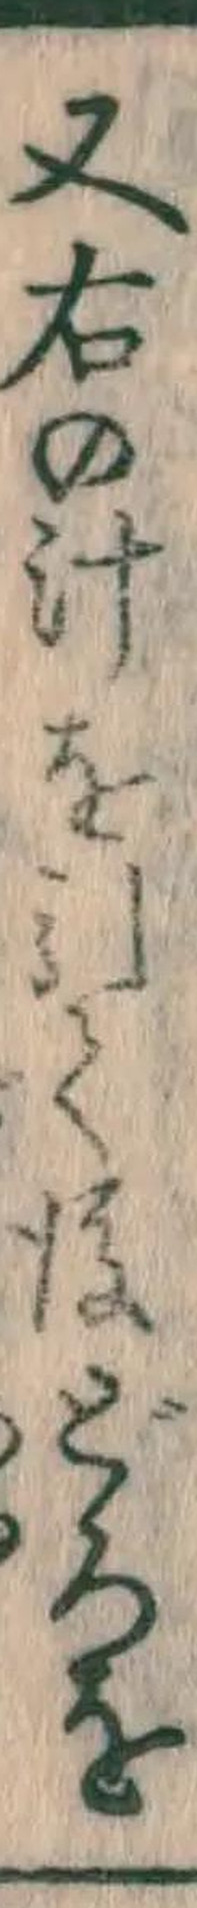又右の汁を引て後どろを
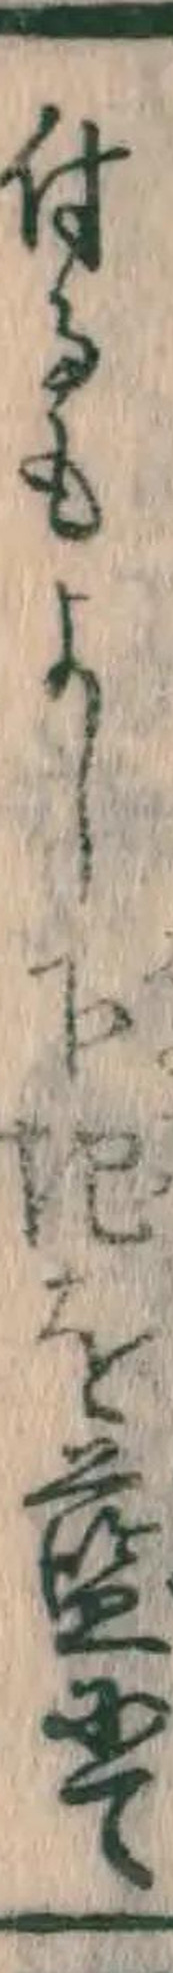付るもよし下地を藍にて
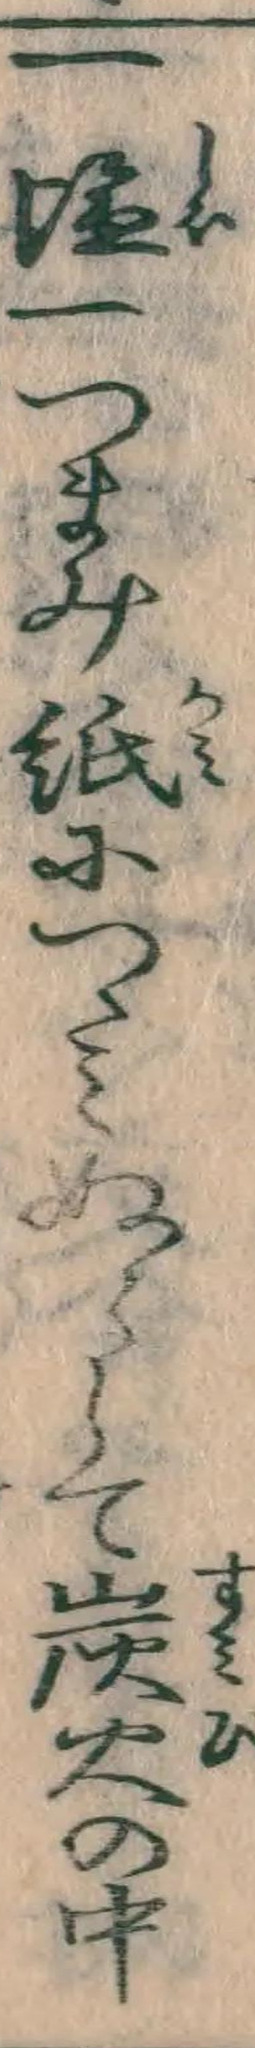一塩一つまみ紙につゝみぬらして炭火の中
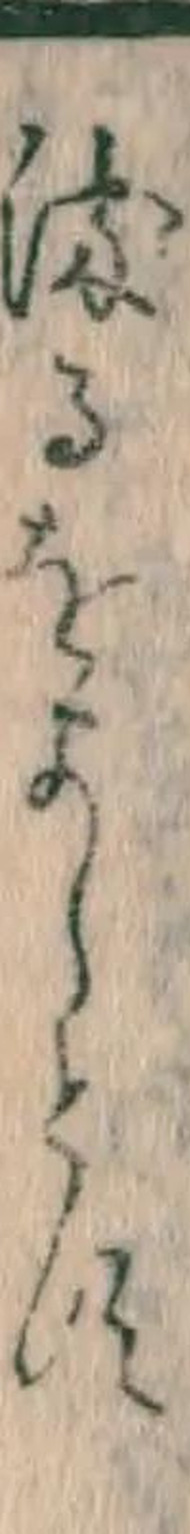染るをよしとす
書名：広益秘事大全 3巻. [3]
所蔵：国立国会図書館 National Diet Library, JAPAN
